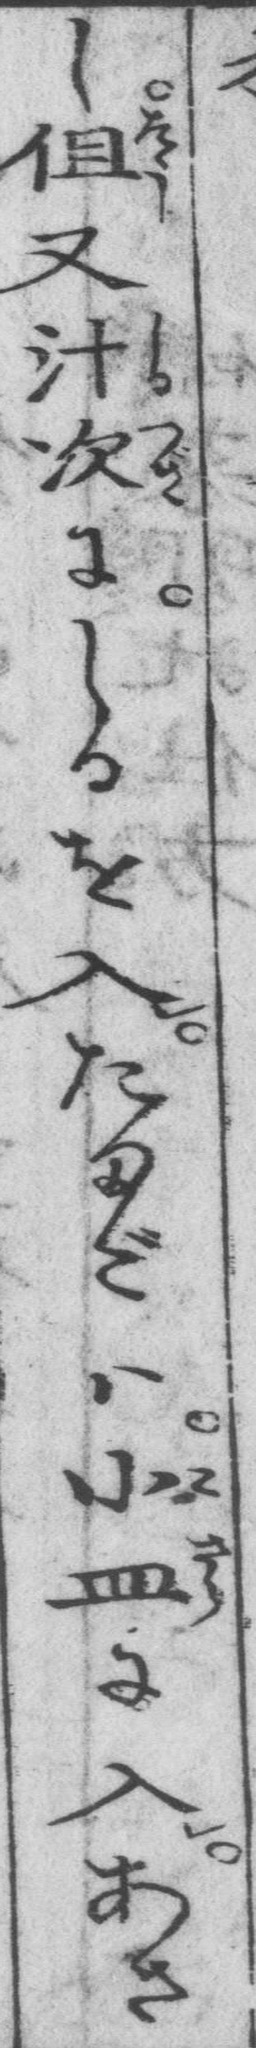し。但又汁次に。しるを入れ。たまごは、小皿に入れ。あさ
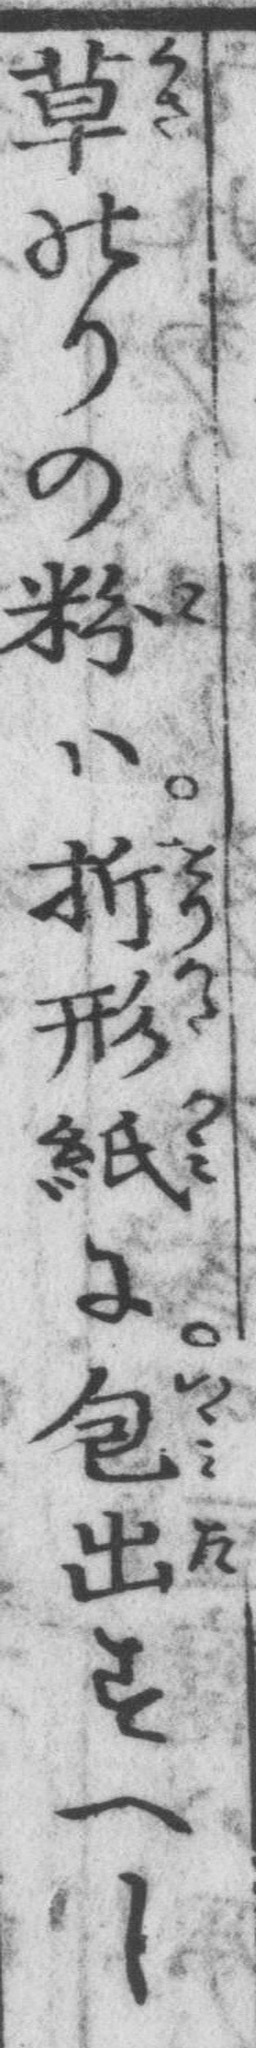草のりの粉は。折形紙に。包出すへし
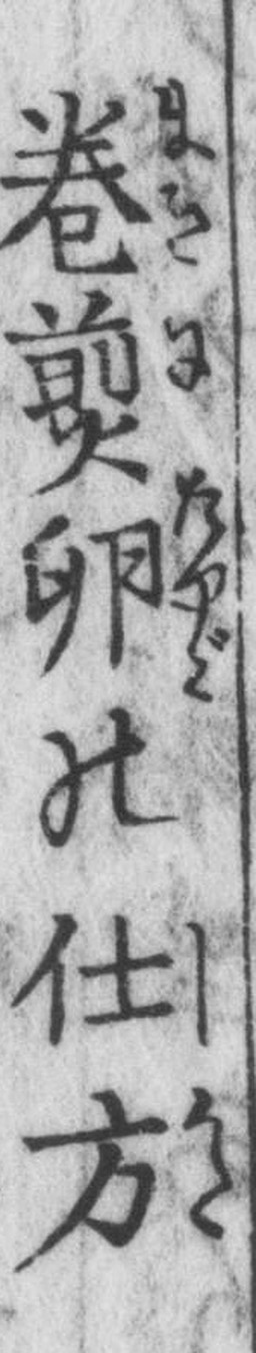巻煎卵の仕方
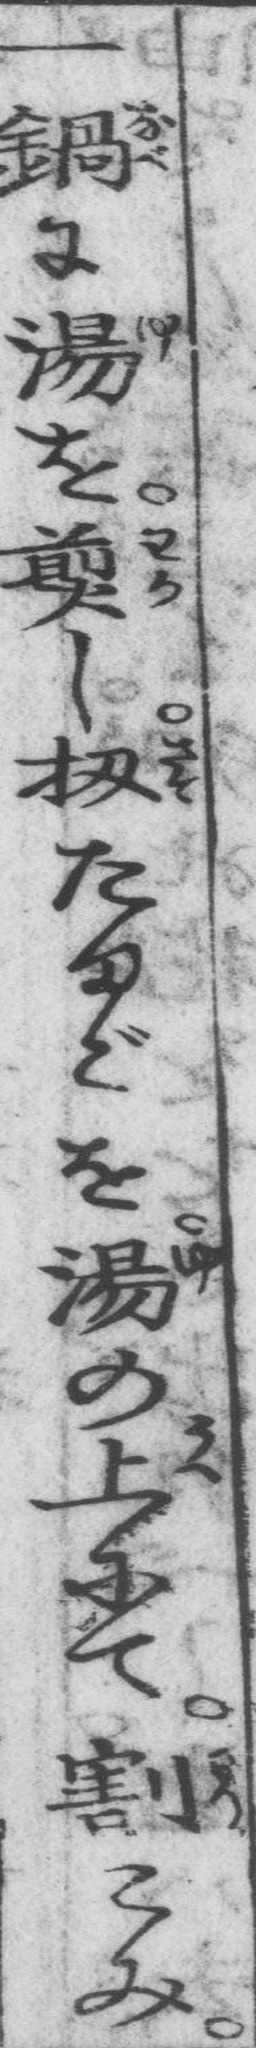一鍋に湯を。煎し。扨たまごを。湯の上にて。割こみ。
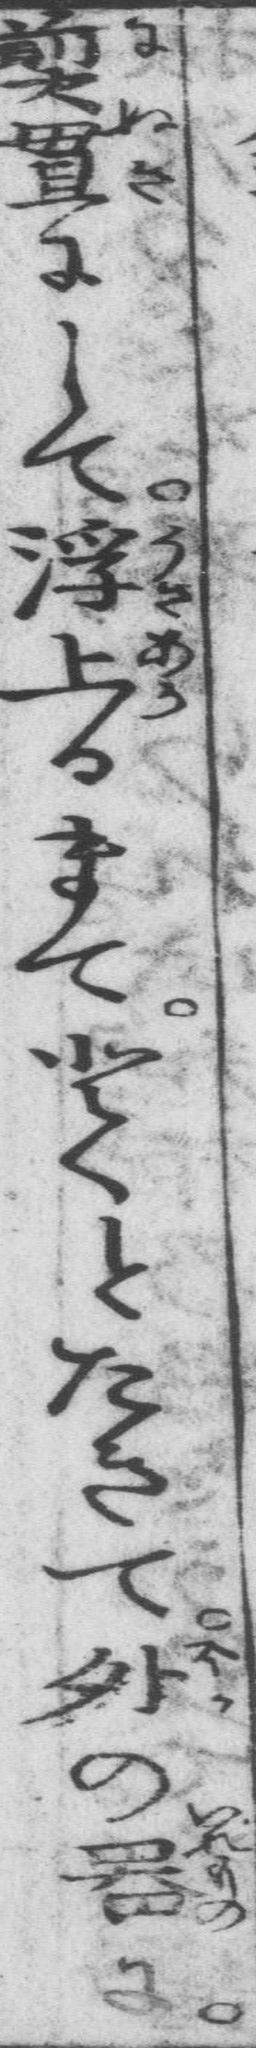煎貫にして。浮上るまて。とくとたきて。外の器に。
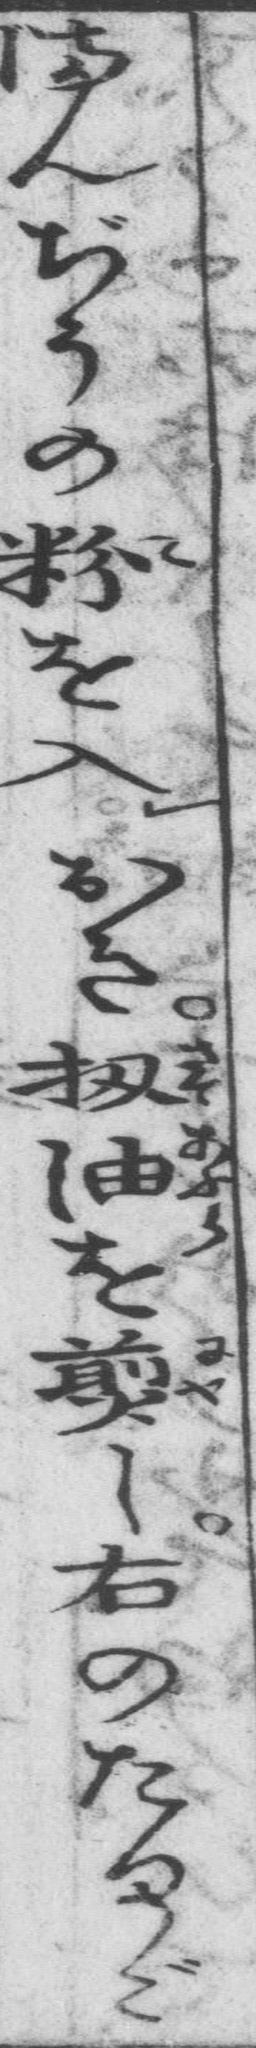まんぢうの粉を入れおき。扨油を煎し。右のたまご
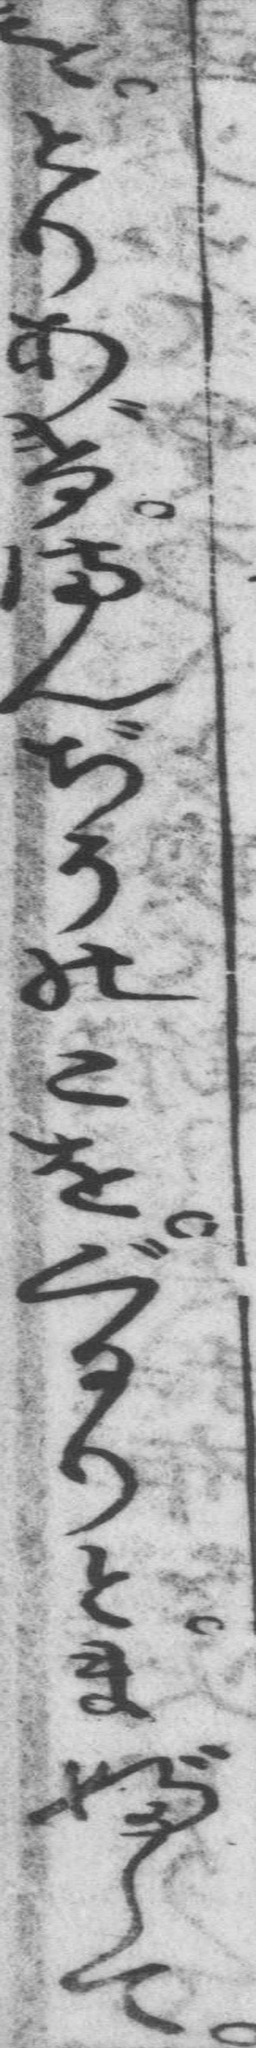も。とりあげ。まんぢうのこをぐるりと。まぶして。
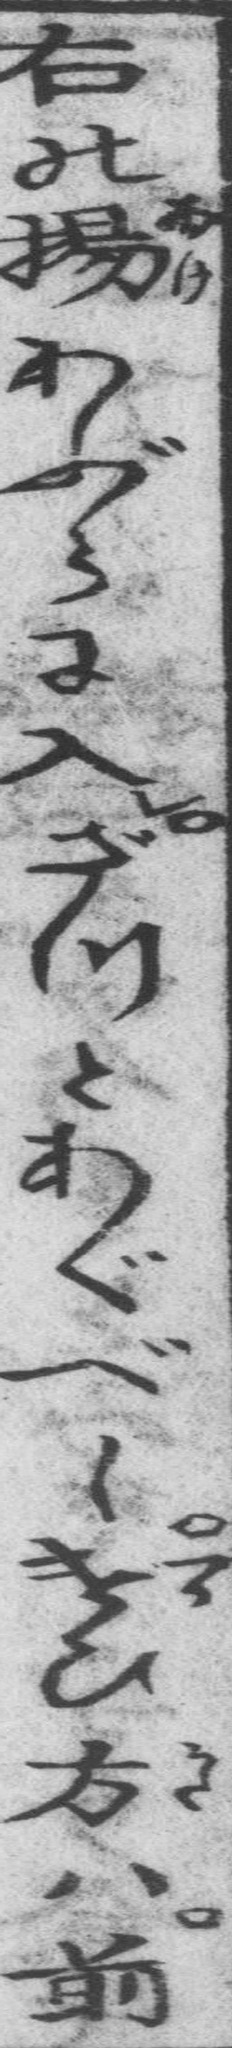右の揚あぶらに入れ。ざつとあぐべし。遣ひ方は。前
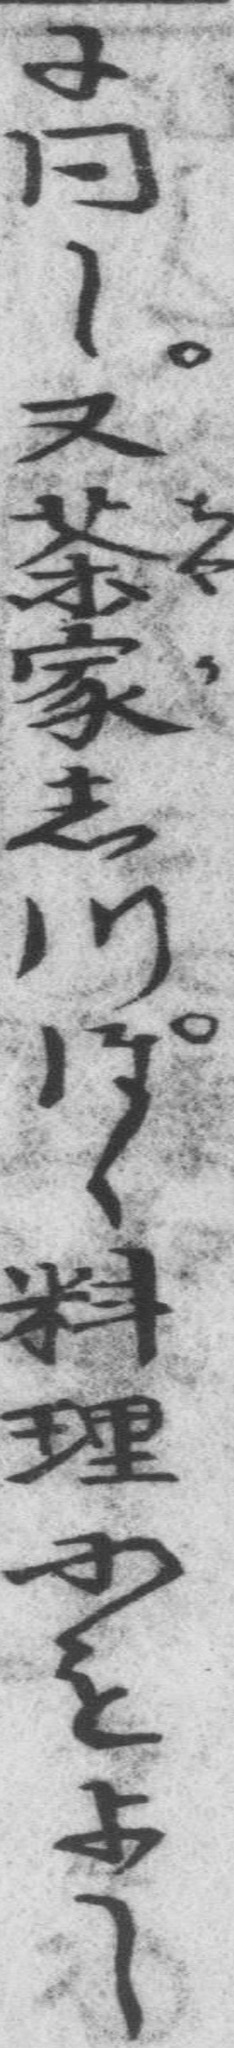に同し。又茶家しつぽく料理にもよし
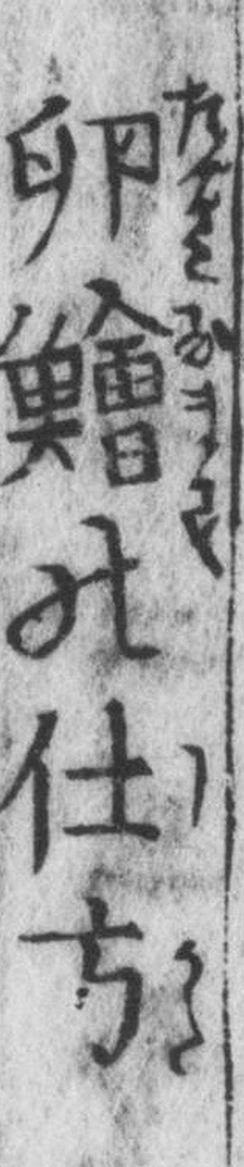卵鱠の仕方
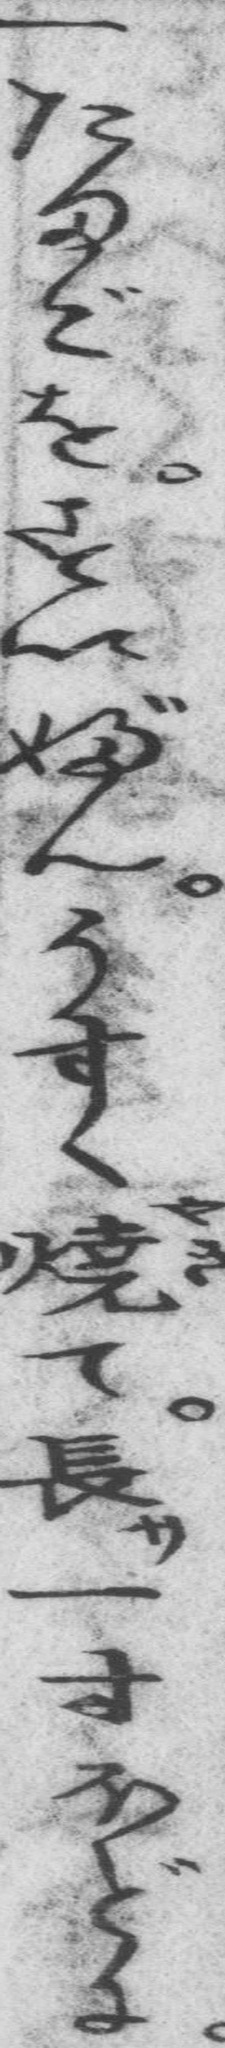一たまごを。すいぶん。うすく焼て。長さ一寸ほどに。
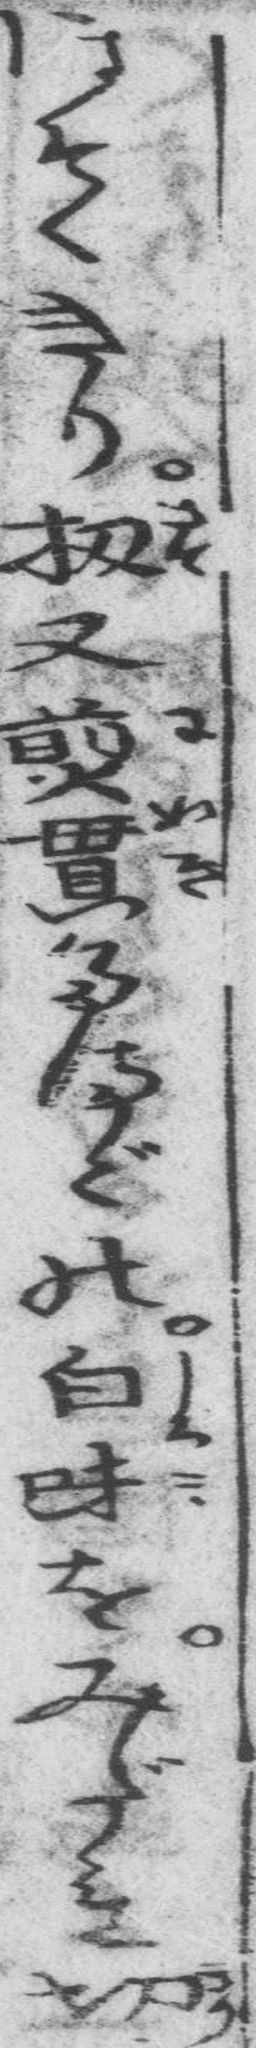ほそくきり。扨又煎貫たまごの。白味を。みだれ切
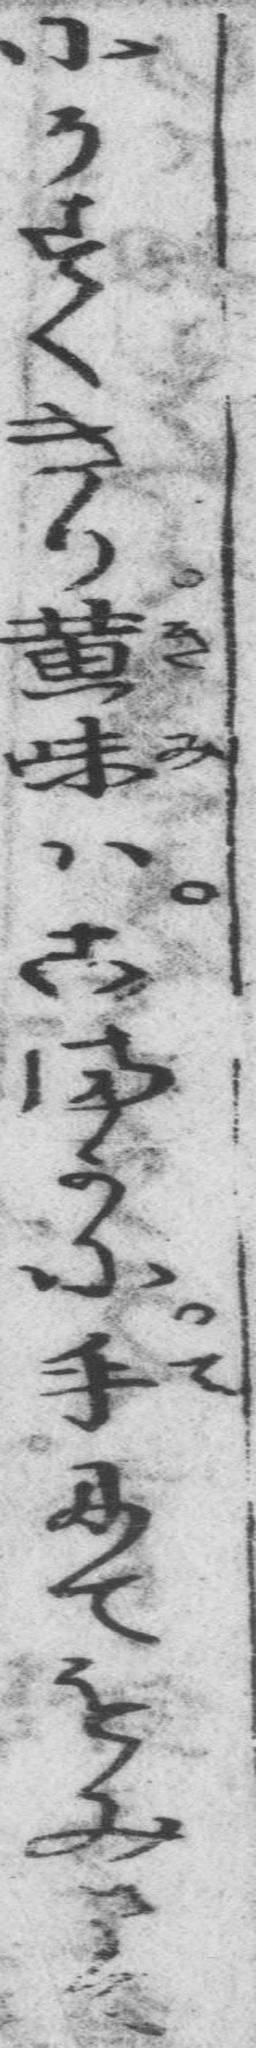にうすくきり。黄味は。こまかに。手にてもみさて
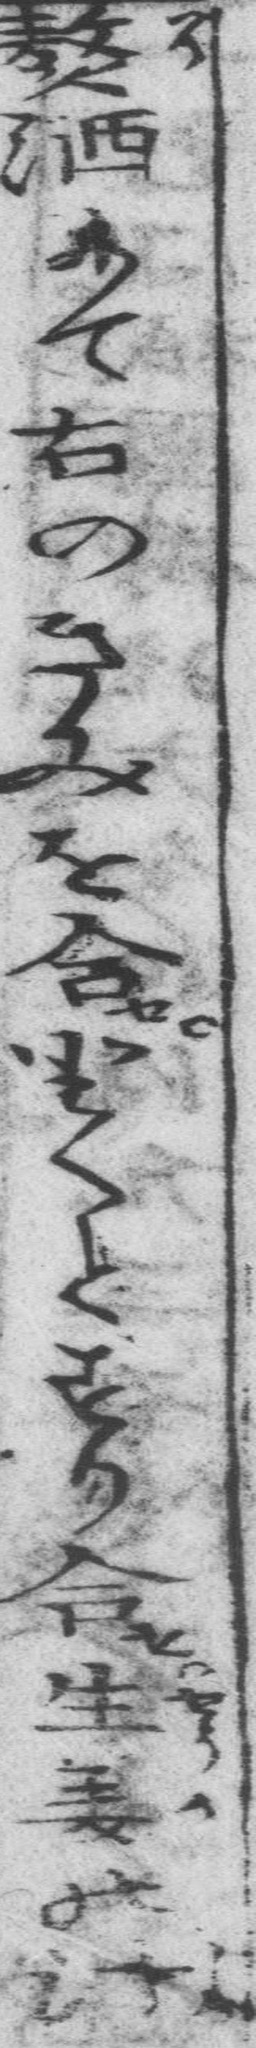熬酒にて右のきみを合せ。とくとすり合す。生姜の汁
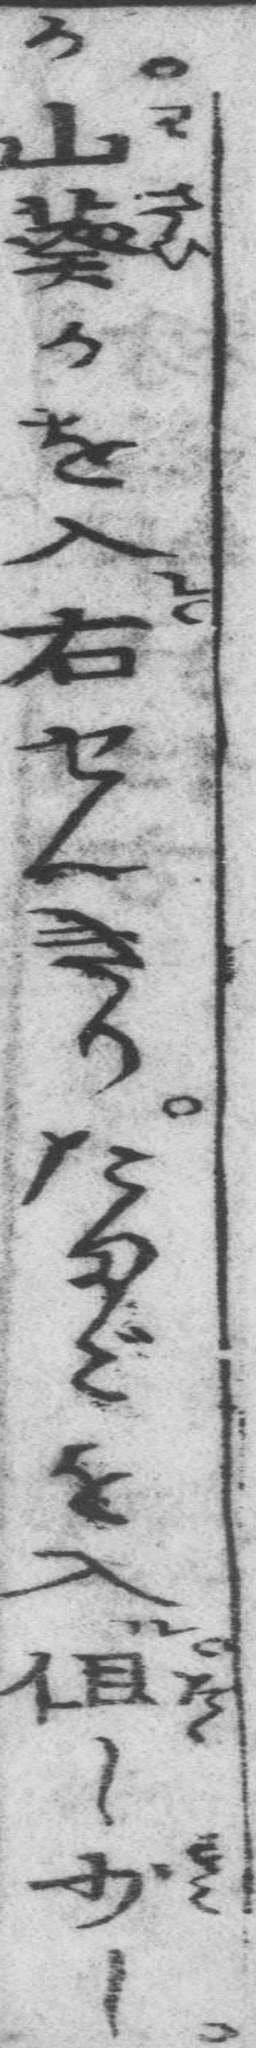か。山葵かを入れ。右せんきり。たまごを入る。但し少し。
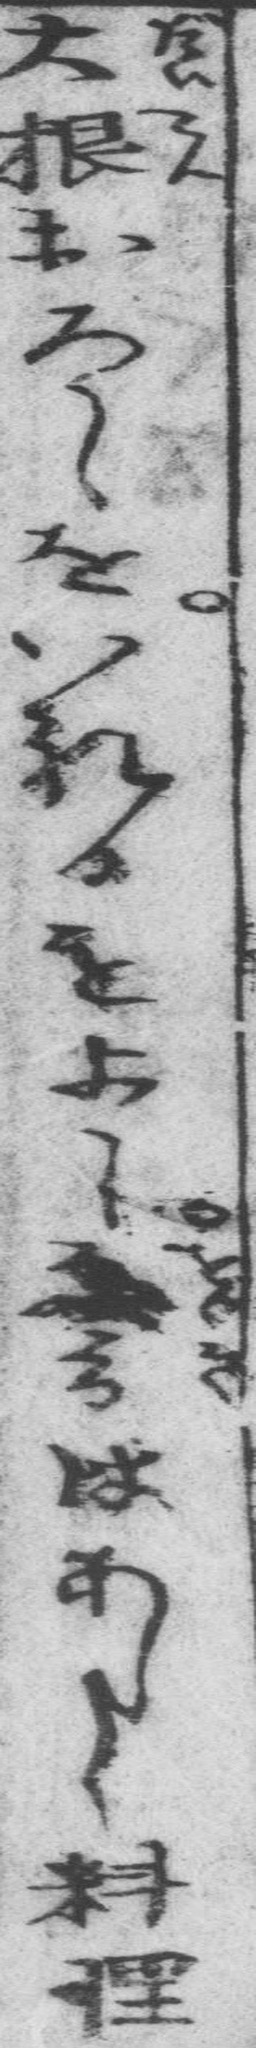大根おろしを。いれるもよし。大分はあくし料理
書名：萬寳料理秘密箱
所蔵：大阪府立大学学術情報センター 国文学研究資料館
